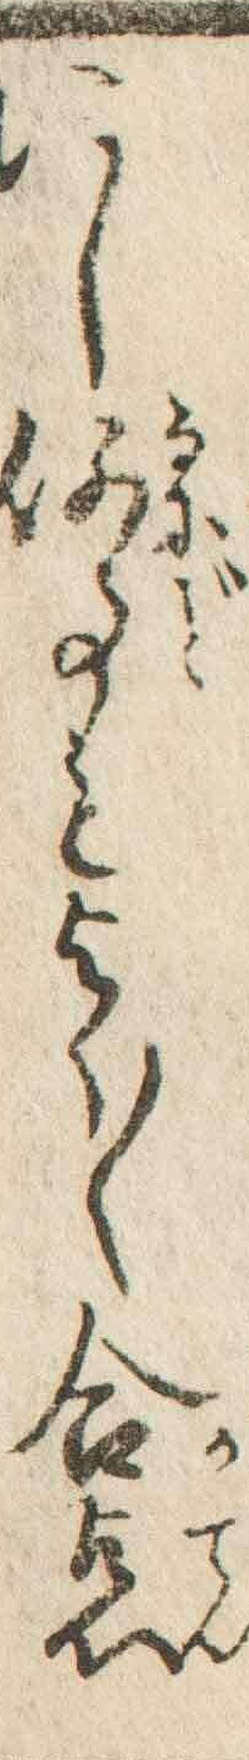にし何事もよく〳〵合点
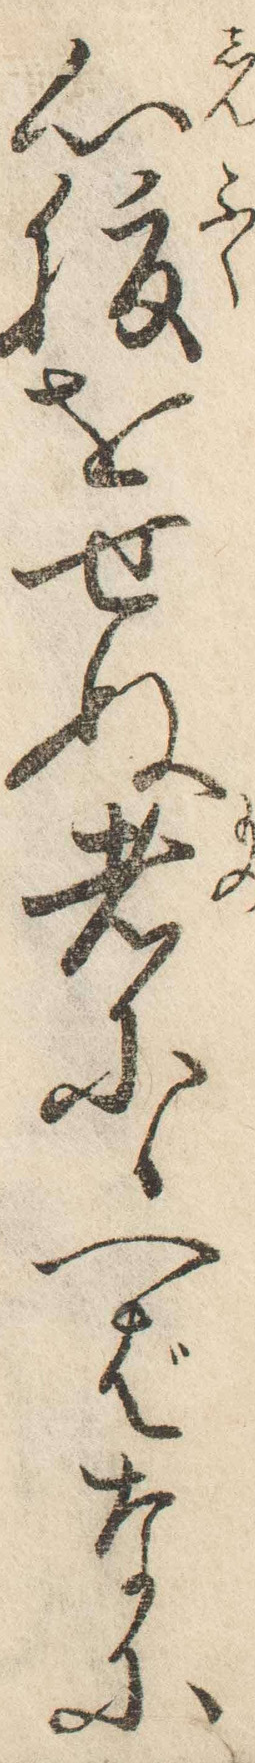心服をせぬ者に候へばなに
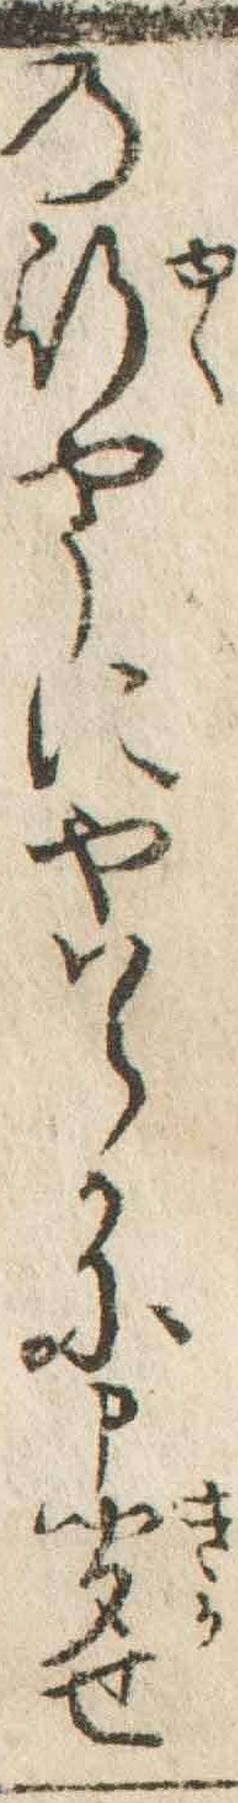の行やうにやはらかに申聞せ
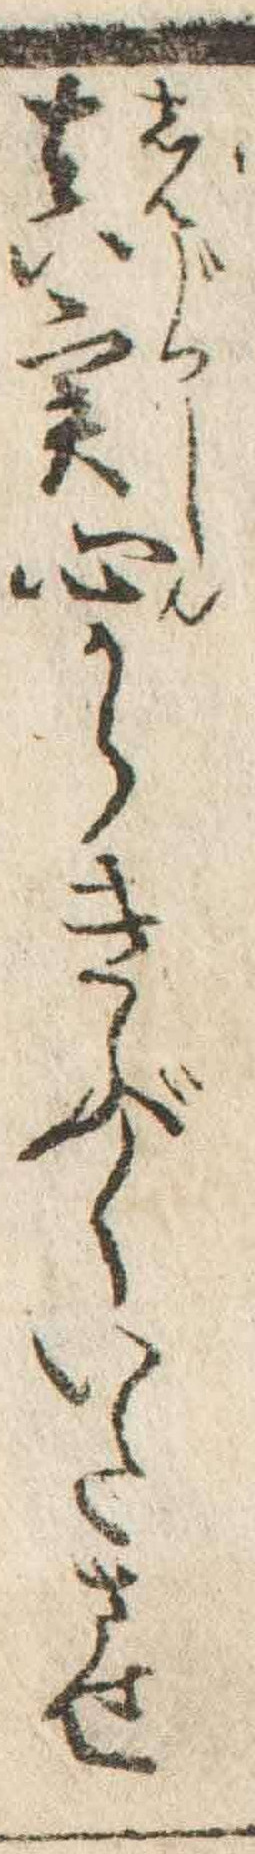真実心からきぶくいたさせ
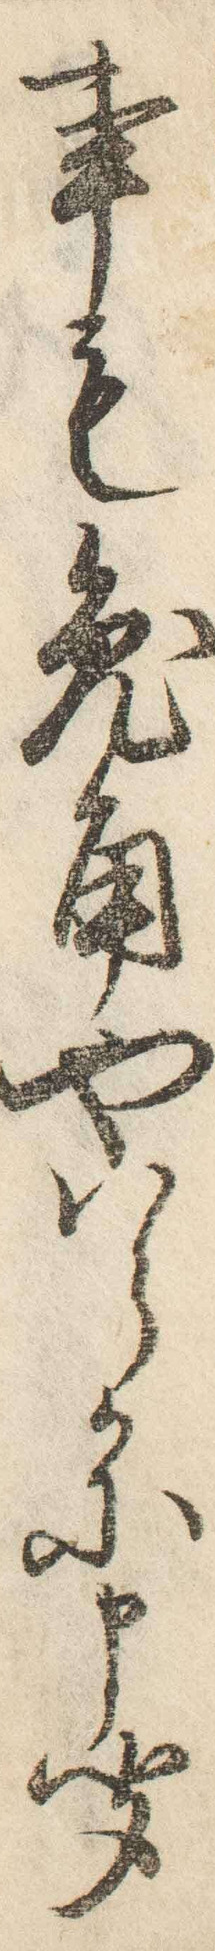事も兎角やはらかに申聞
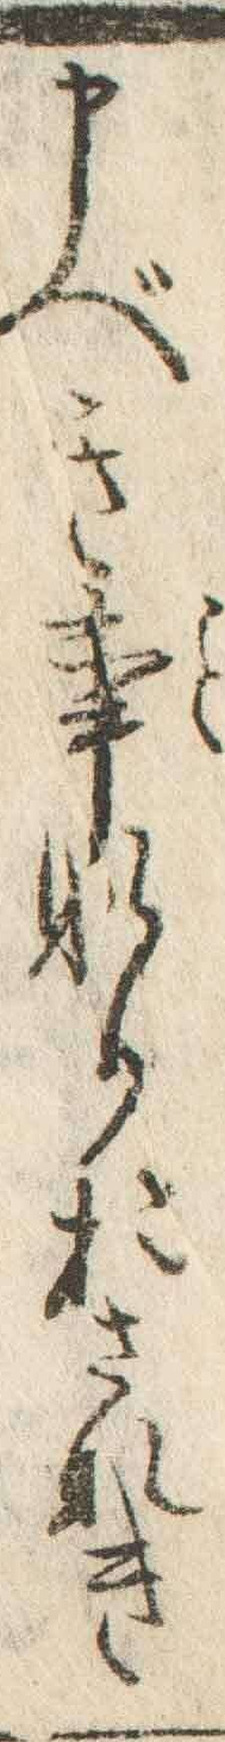申べき事なりおさなき
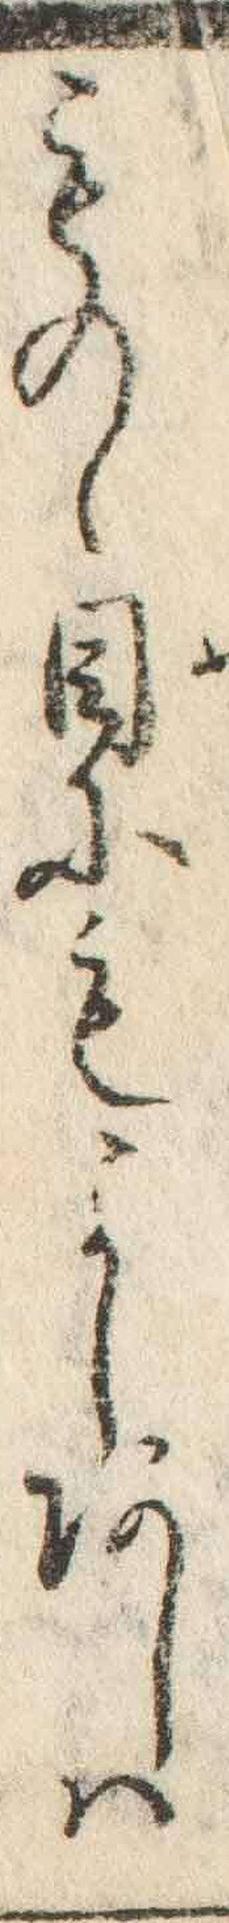ものゝ目にもよしあしは
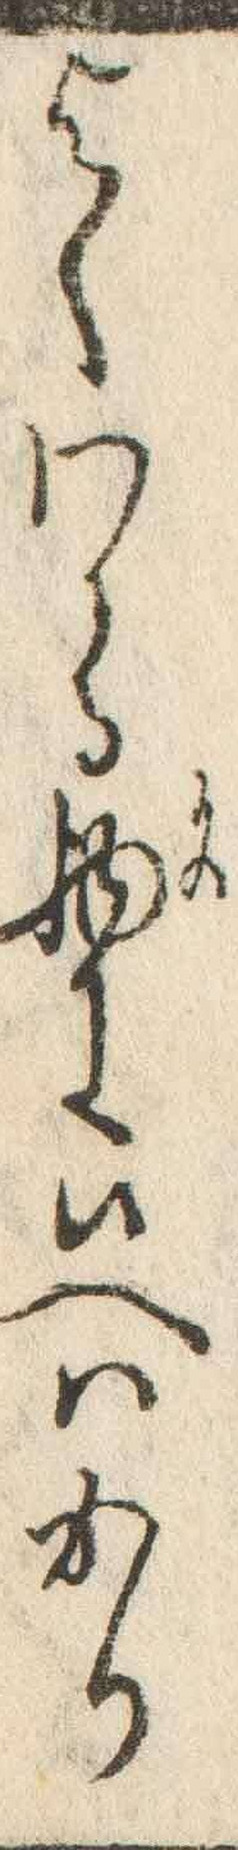よくわかる物に候へはかり
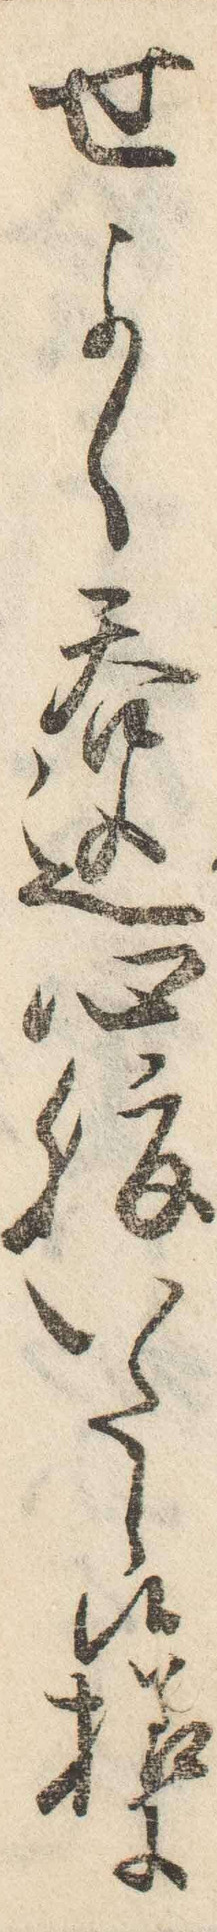せよく呑込心服いたし候様に
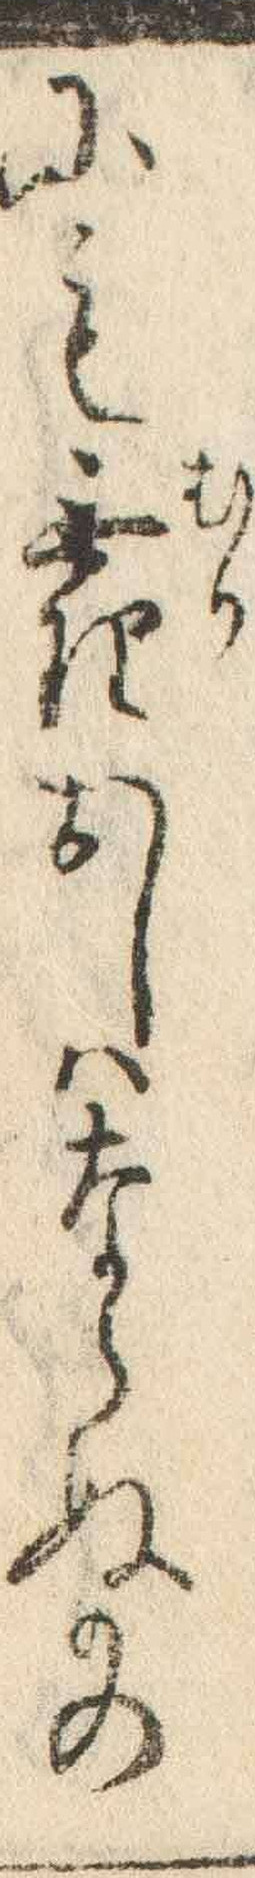にも無理おしはならぬもの
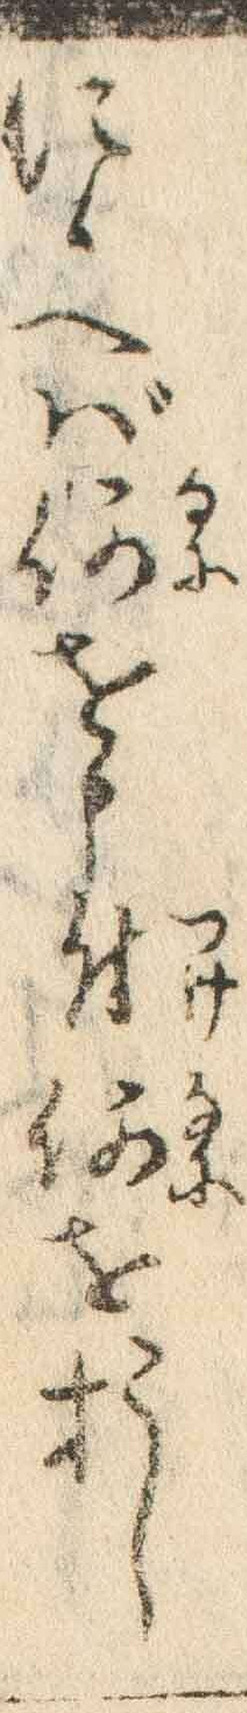に候へば何を申付何をおし
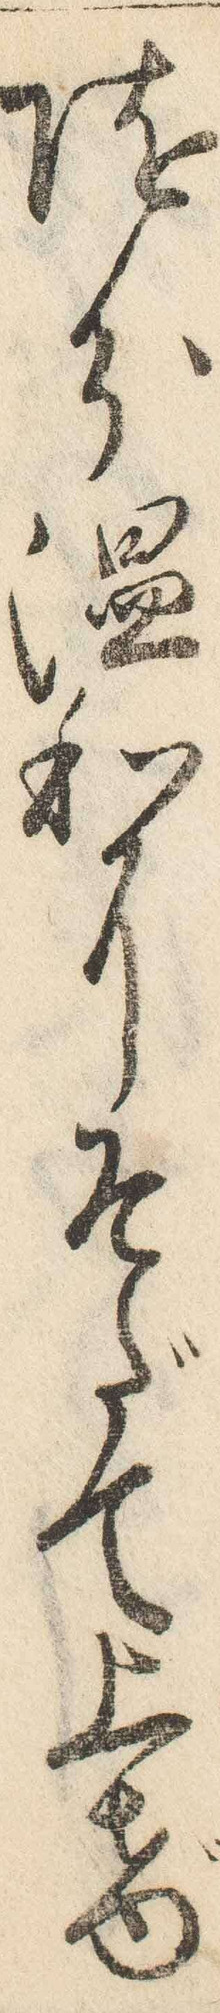随分温和にそだて上げ
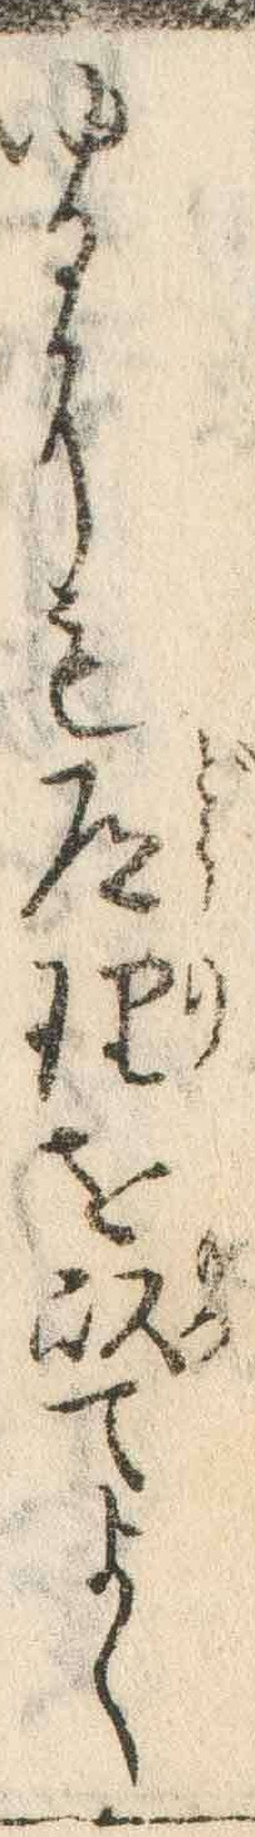ゆるにも道理を以てよく
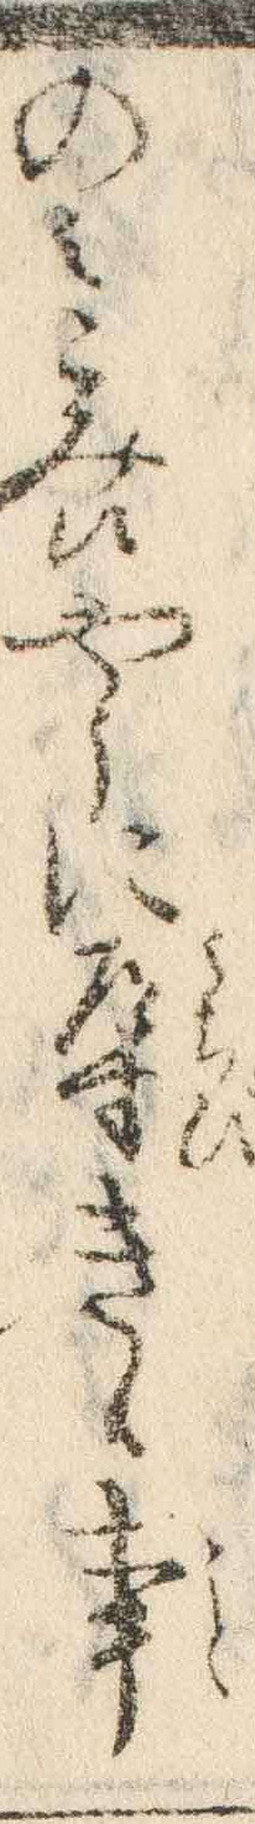のみこみ候やうに導き候事
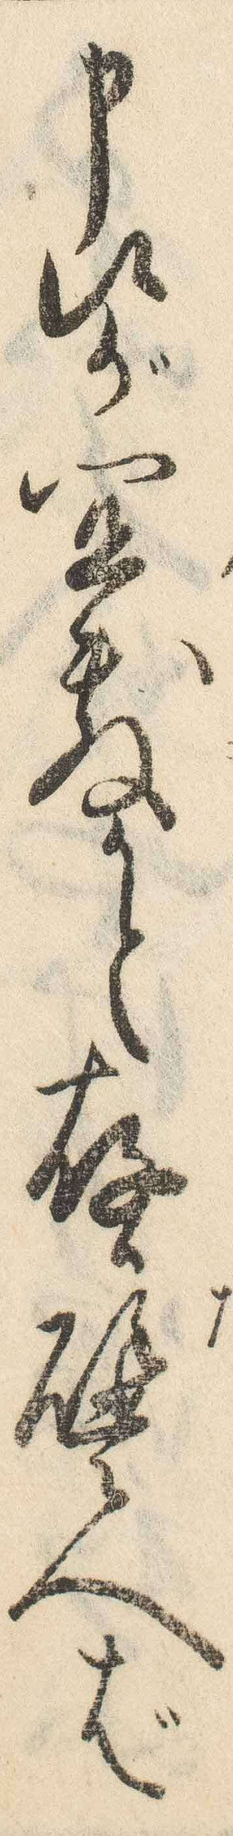申候が宜敷かと存候譬へば
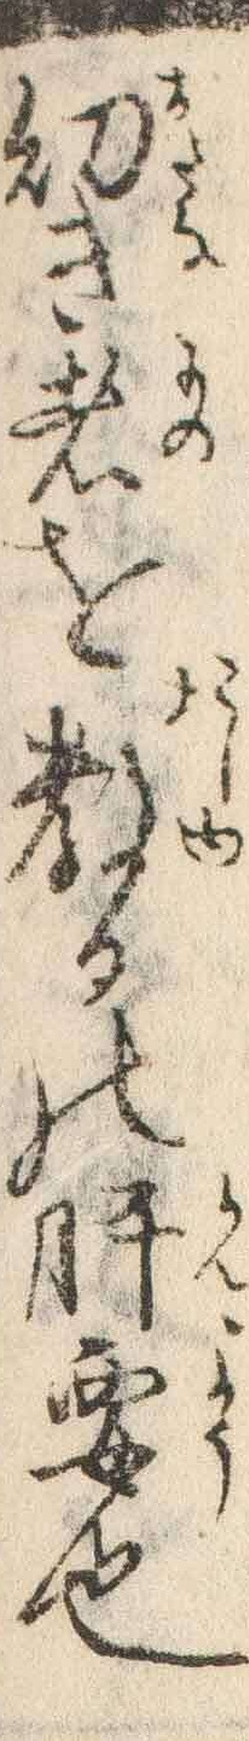幼き者を教るの肝要也
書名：撫育草
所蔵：東京学芸大学附属図書館 国文学研究資料館
